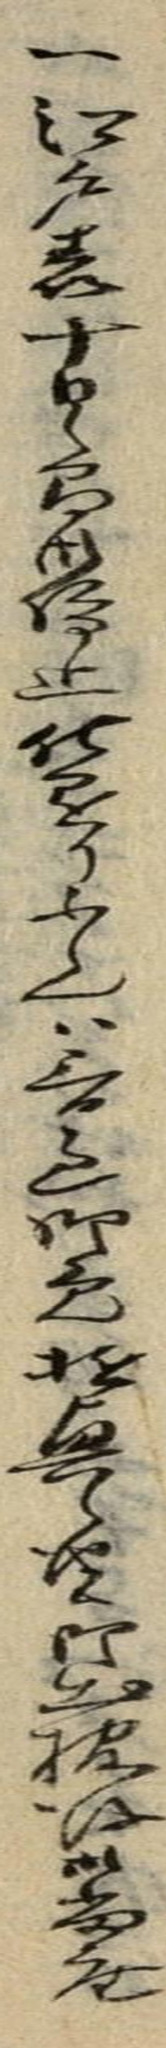一江戸表十日之間御停止仕懸りふしんは三日過御免遊興之儀は御出棺後御当座
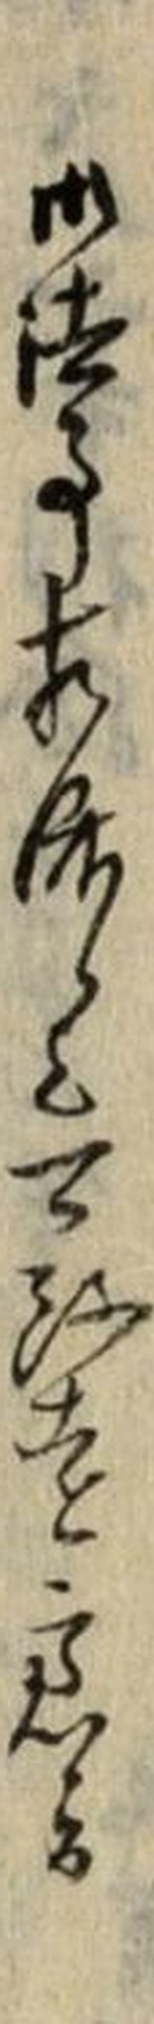御法事相済候迄可致遠慮旨
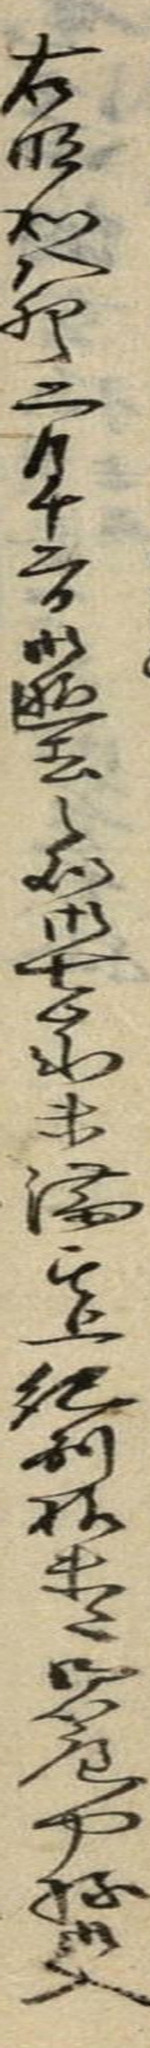右明和八卯二月十二日御逝去之処御七歳未満其上紀州様未た御簾中様御入
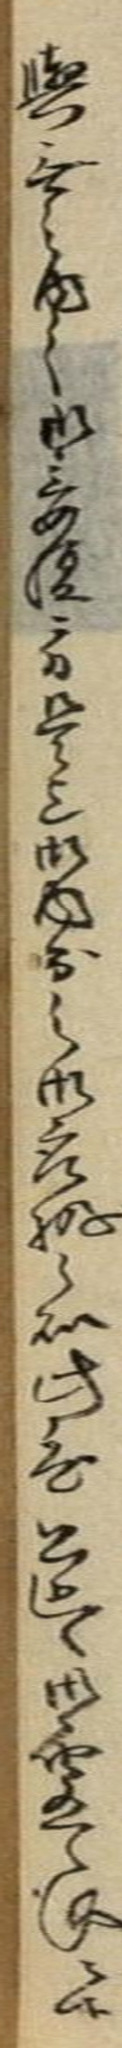輿無之内之御妾腹に付是迄御内分之御取扱之処此度公辺へ御届有之趣に候
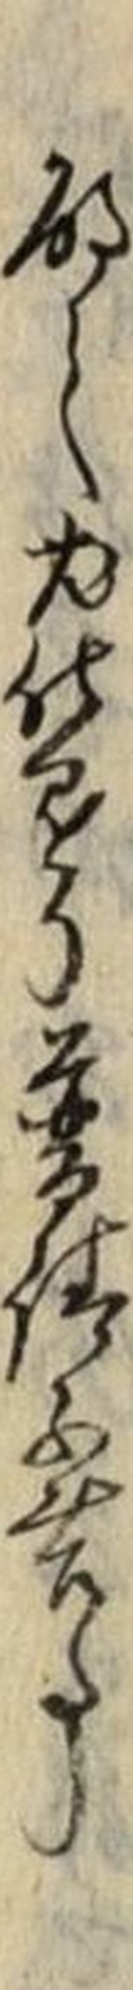触之尤仕懸り普請不苦事
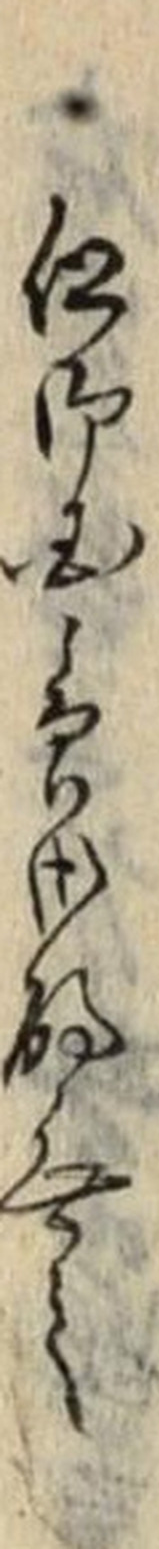但御国にては御触無之
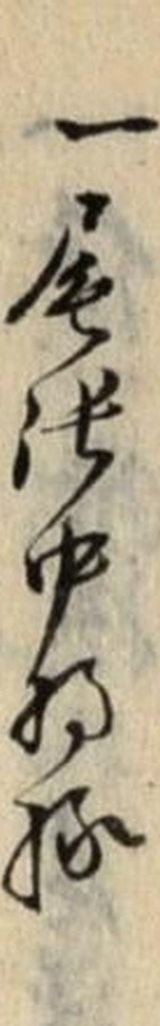一尾張中将様
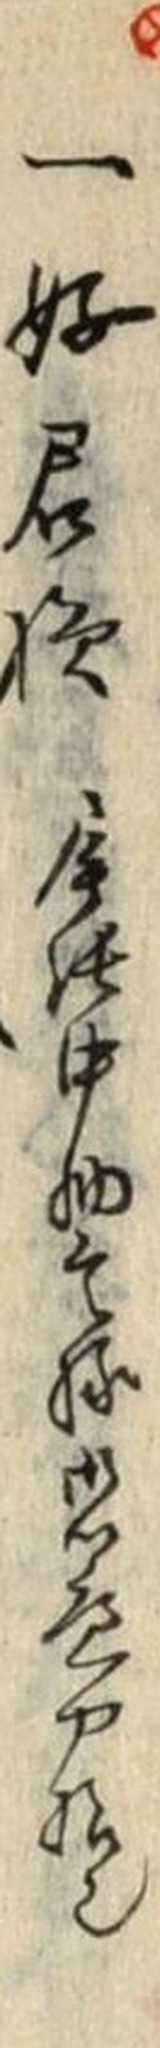一好君様尾張中納言様御簾中様也
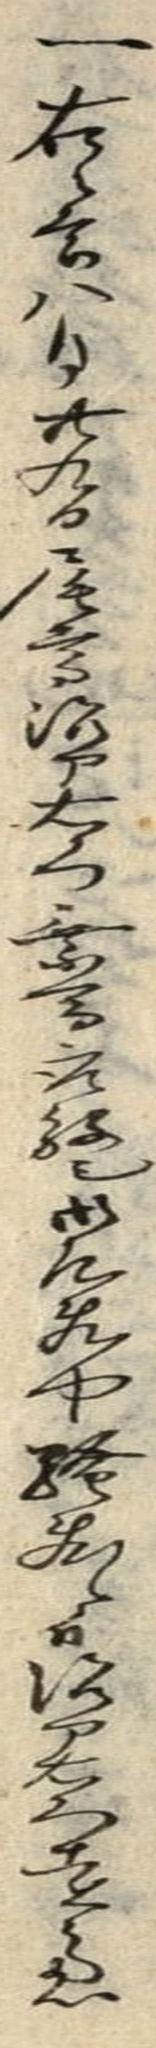一右之節八月廿九日尾高治部右衛門乗馬取放シ御屋敷中騒敷候に付治部右衛門遠慮
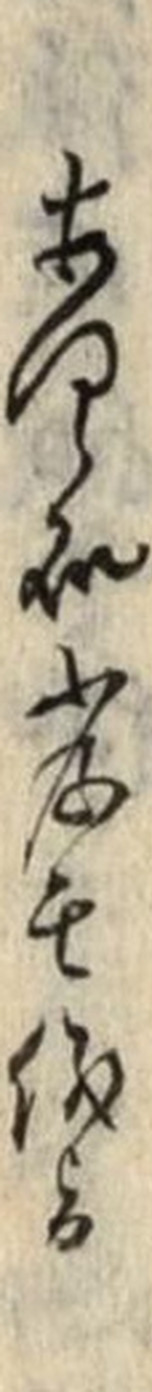相伺候処不及其儀旨
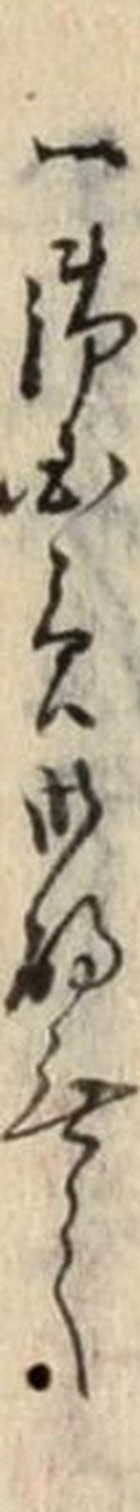一御国にては御触無之
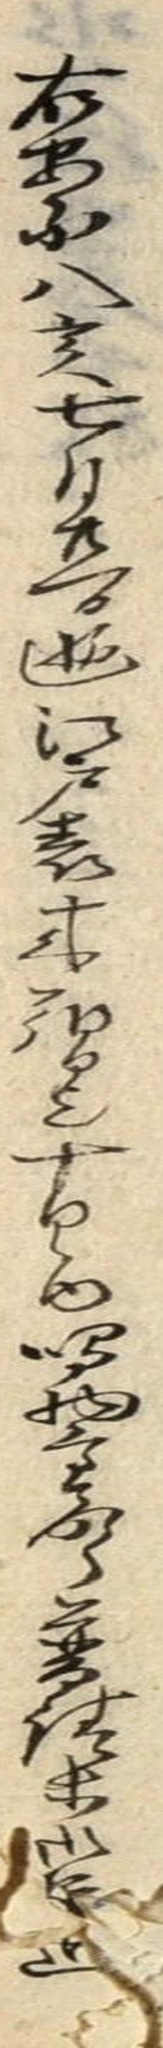右安永八亥七月廿一日逝江戸表来朔日迄十日之内鳴物高声普請等御停止
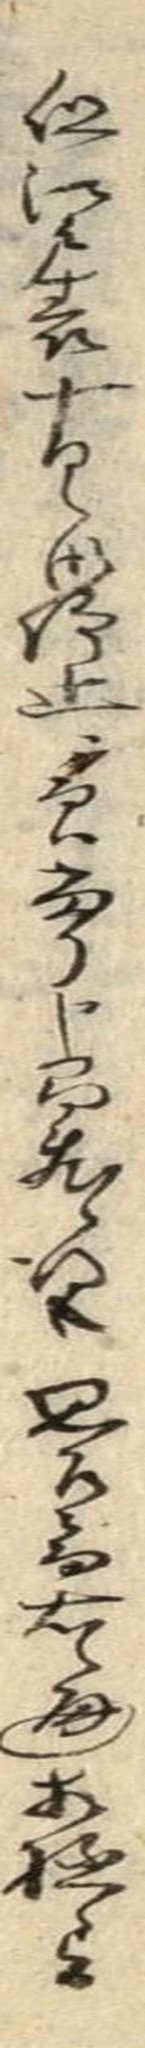但江戸表十日之御停止にては当り申間敷候得共思召にて右之通相極候旨
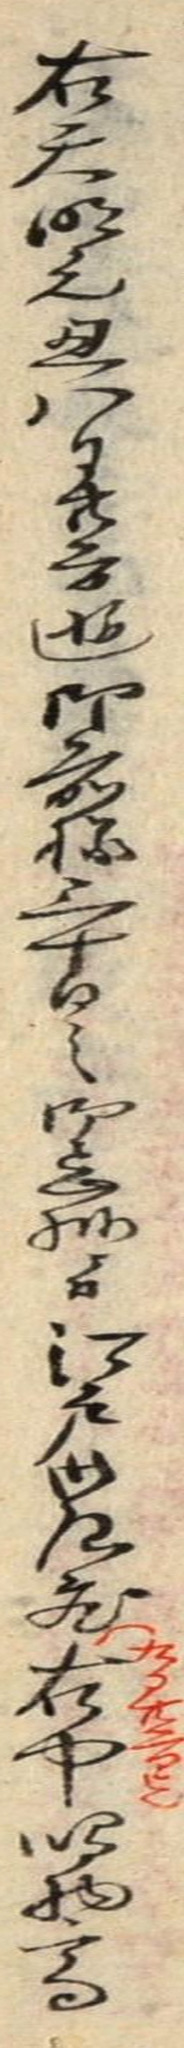右天明元丑八月廿二日逝御前様三十日之御忌掛に付江戸御屋敷右中鳴物高

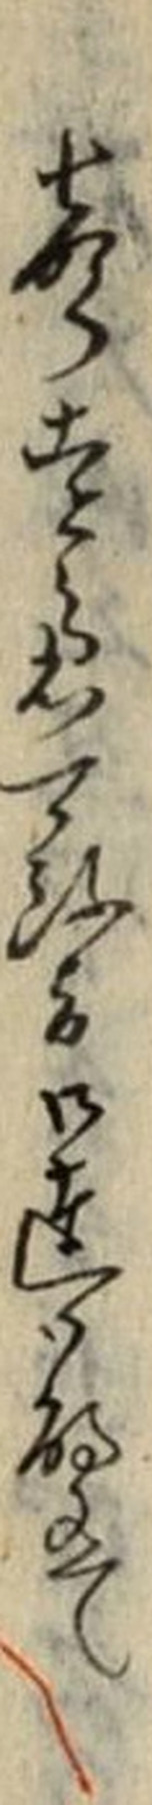声遠慮可致旨口達御触有之
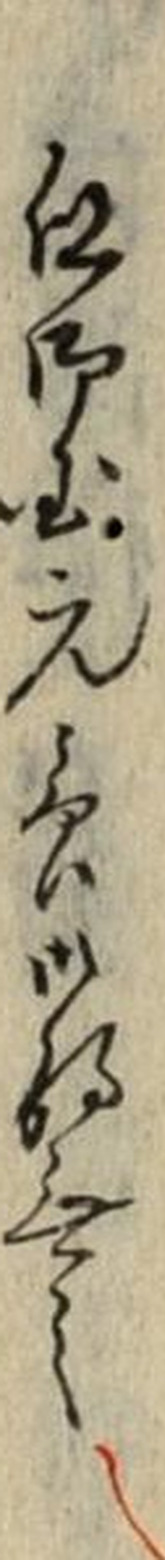但御国元にては御触無之
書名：御停止異変死失
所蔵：福井県文書館 Fukui Prefectural Archives
